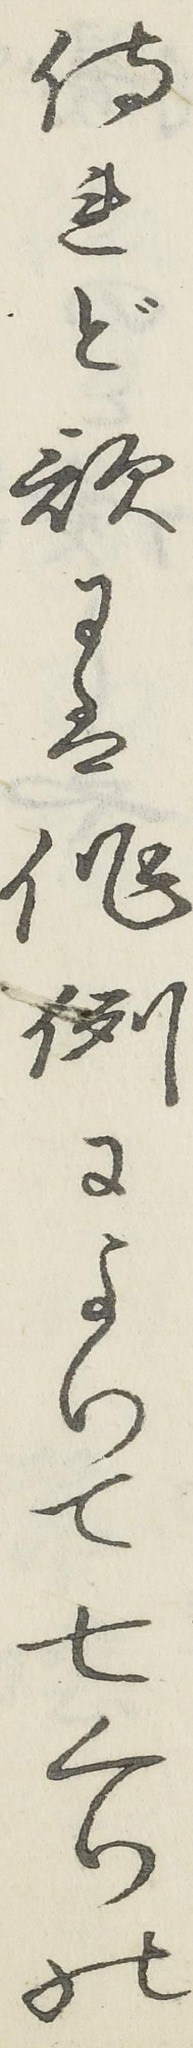侍れど歌には作例によりて七くりの

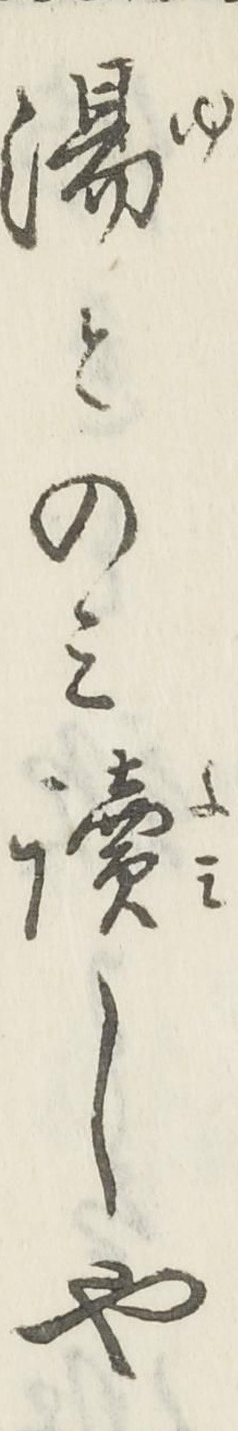湯とのみ読しや
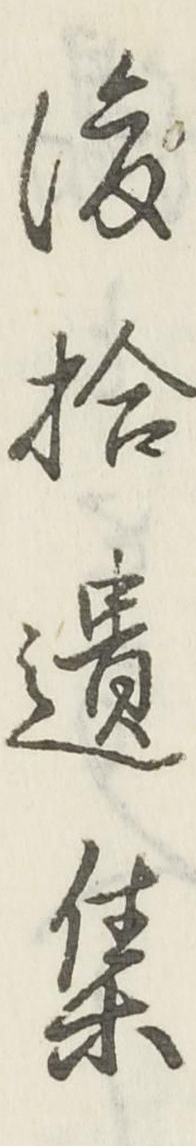後拾遺集
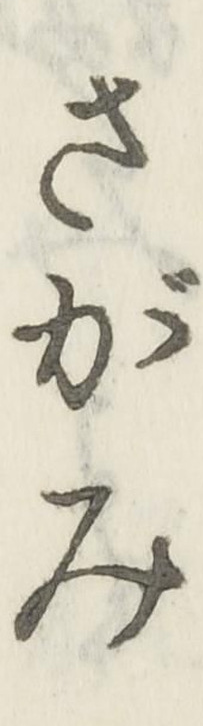さがみ
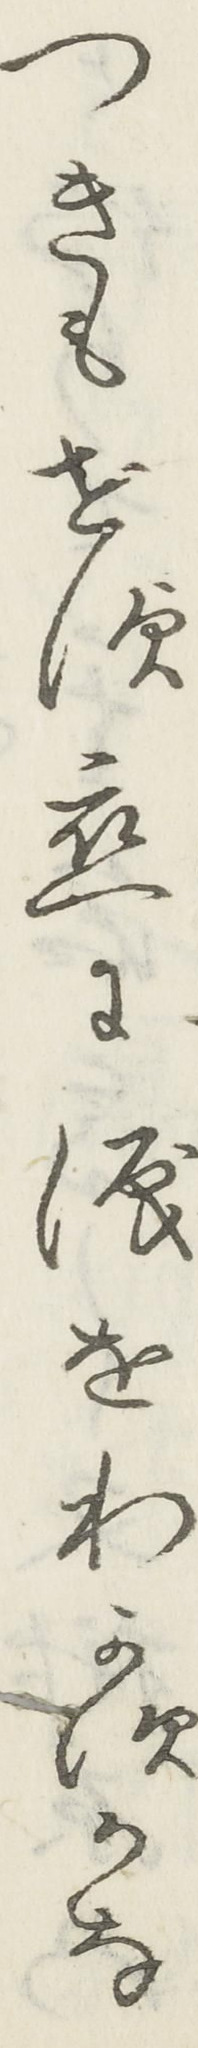つきもせず恋に涙をわかすかな
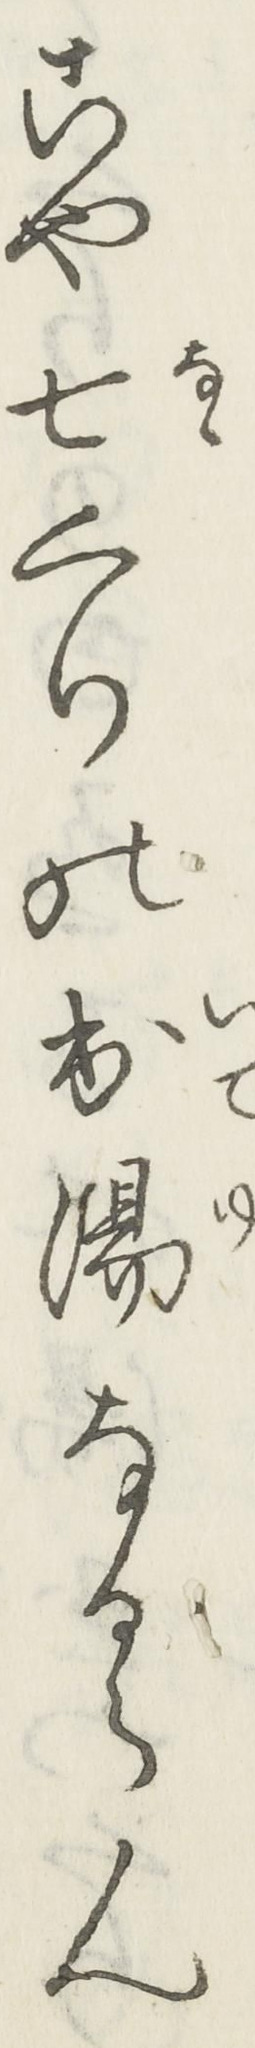こや七くりの出湯なるらん
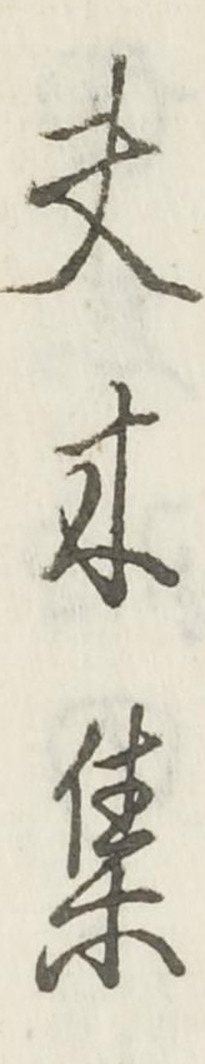夫木集
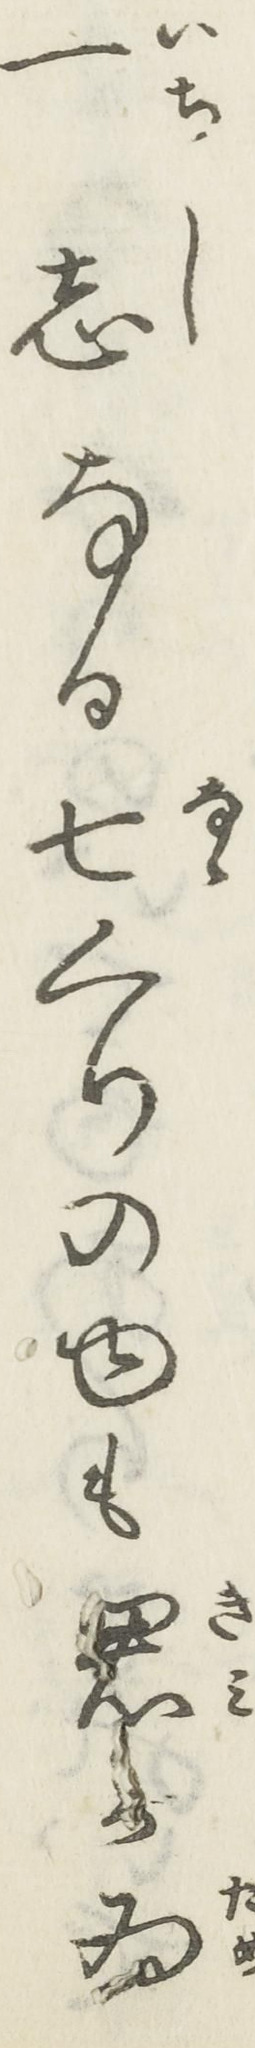一志なる七くりのゆも君が為
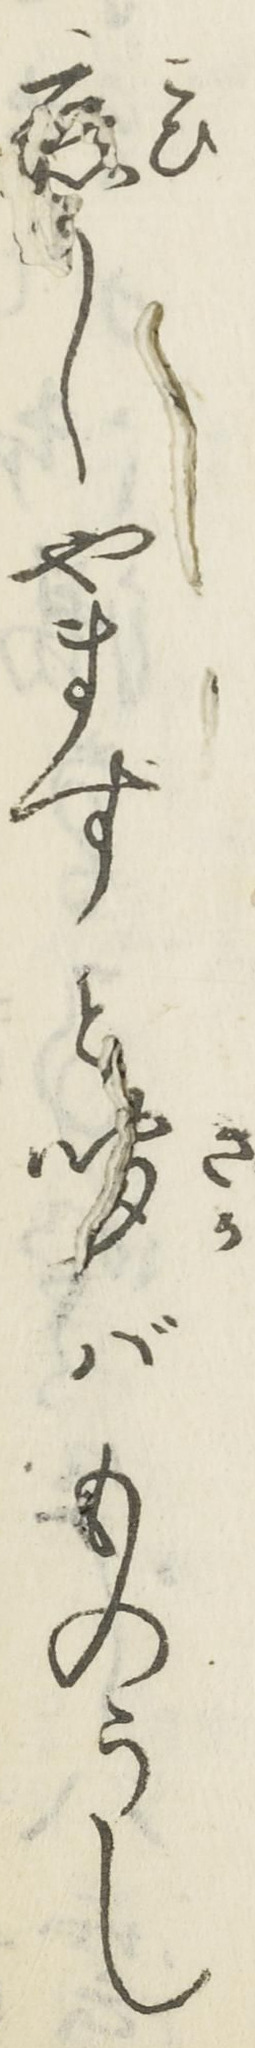恋しやますと聞ばものうし
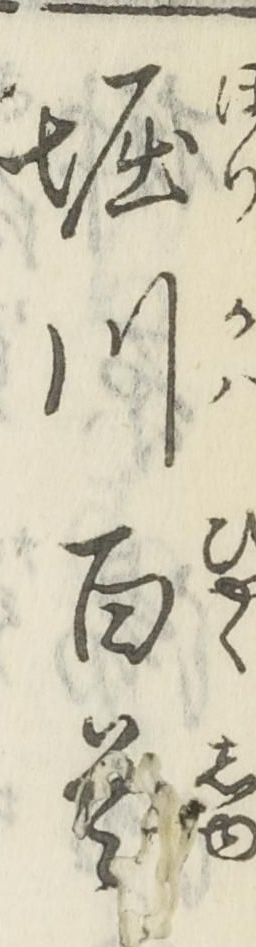堀川百首
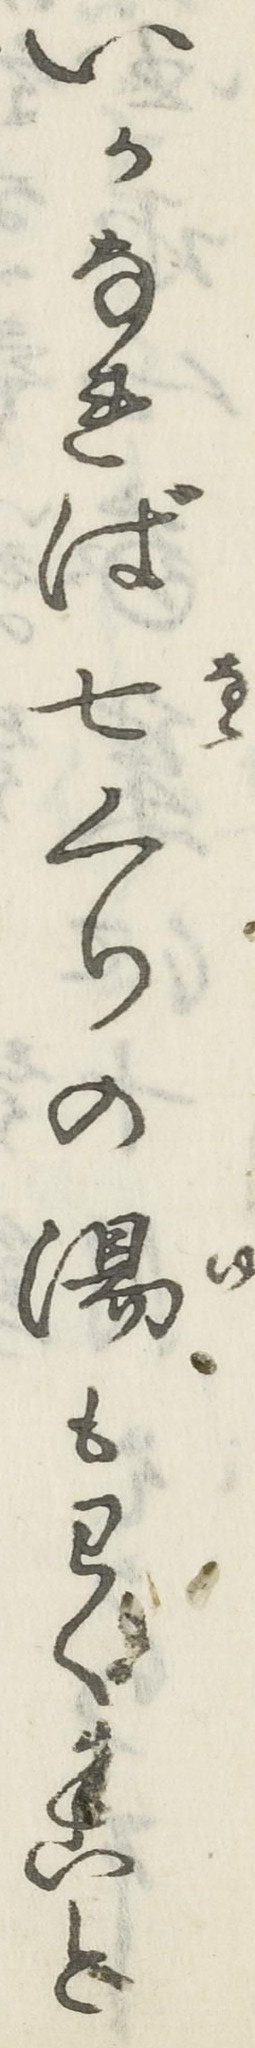いかなれば七くりの湯もわくかこと
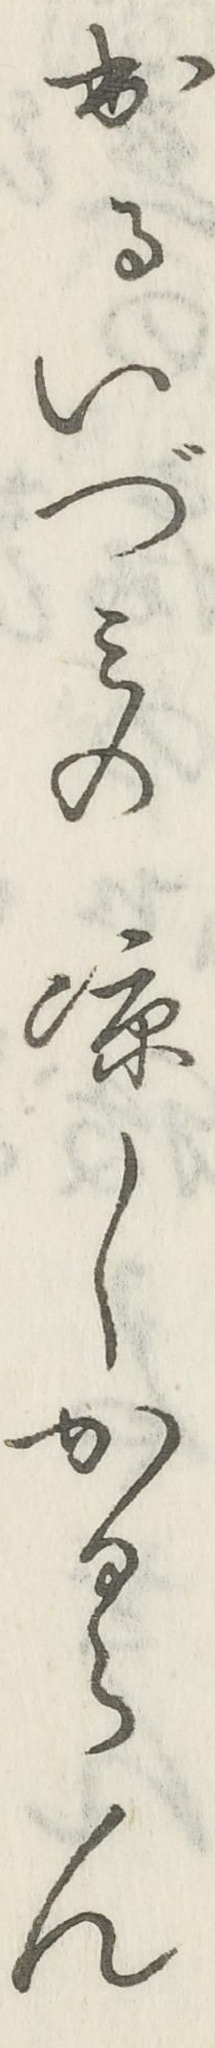出るいづみの涼しかるらん
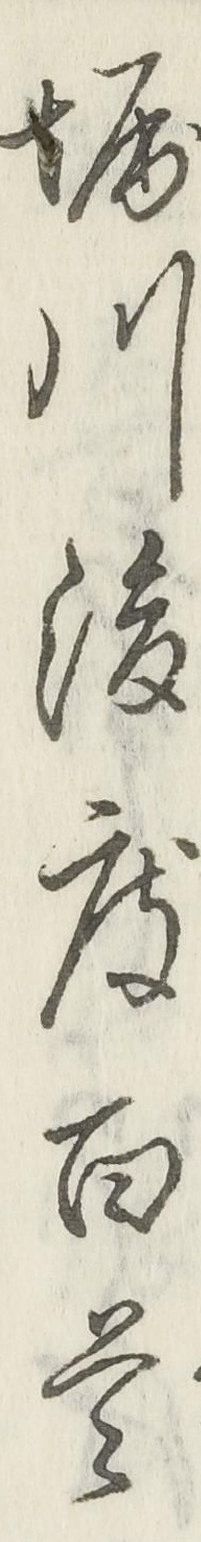堀川後度百首
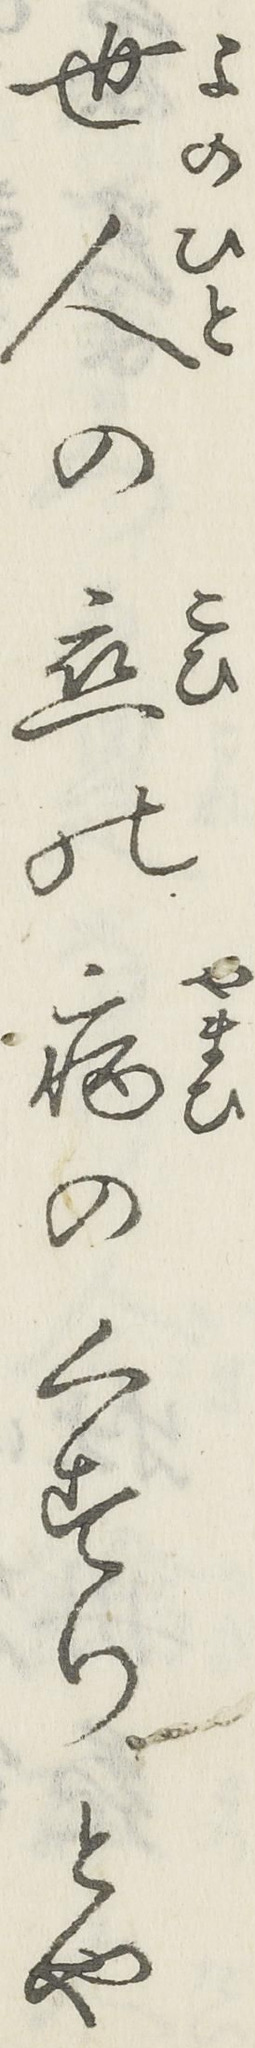世人の恋の病のくすりとや
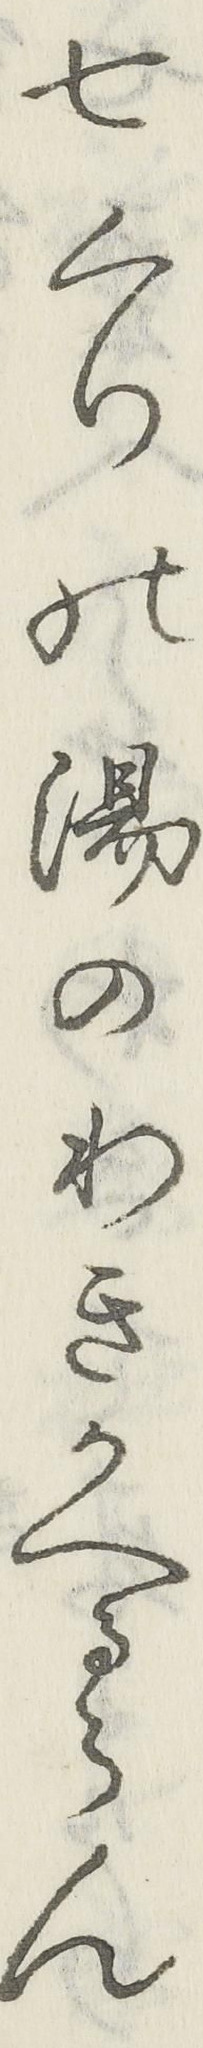七くりの湯のわきかへるらん
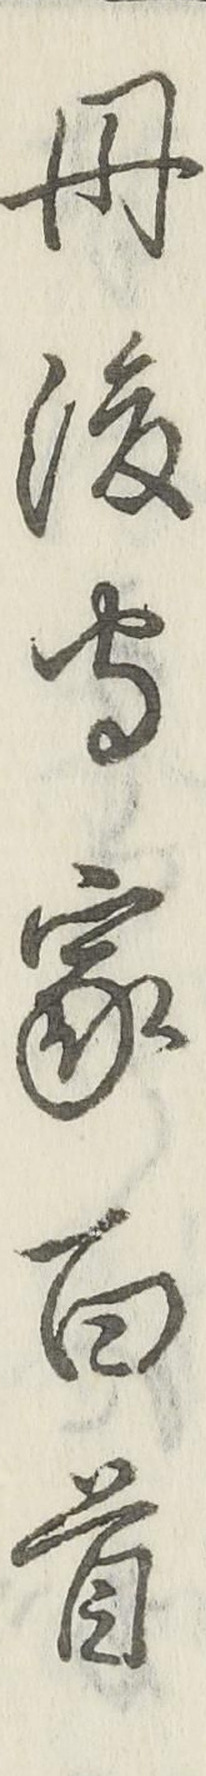丹後守家百首
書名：温泉来由記
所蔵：東京大学地震研究所図書室 Earthquake Research Institute Library, The University of Tokyo, JAPAN
